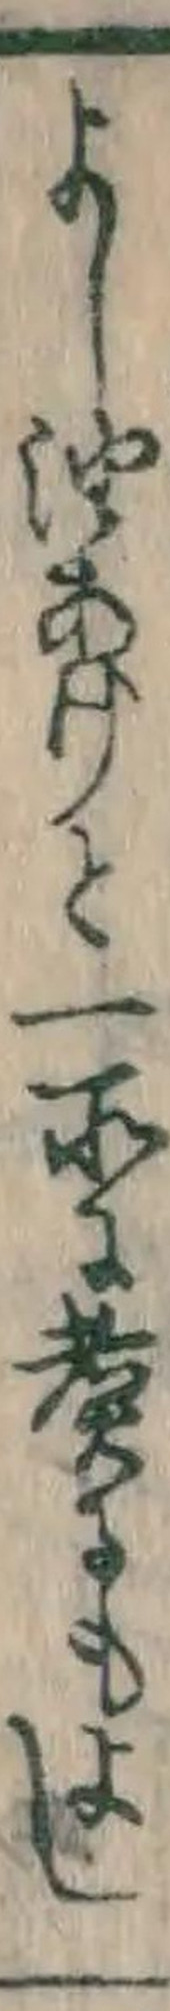よし油あけと一所に煮るもよし
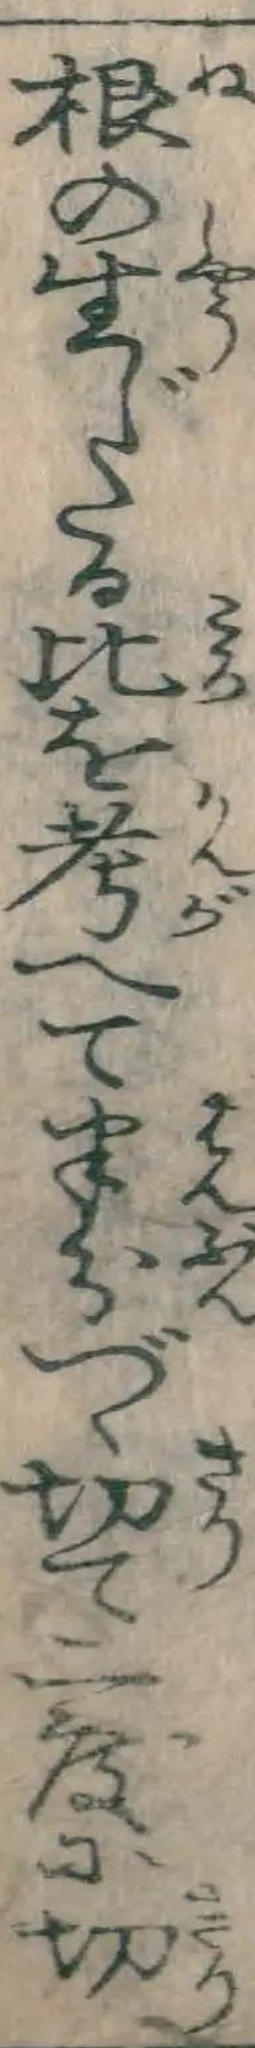根の生じたる比を考へて半分づゝ切て二度に切

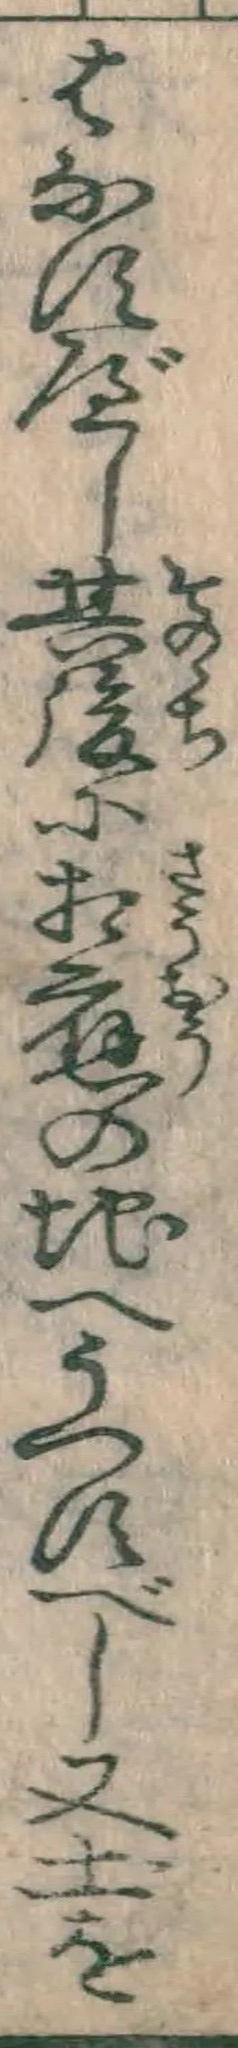はなすべし其後に相応の地へうつすべし又土を
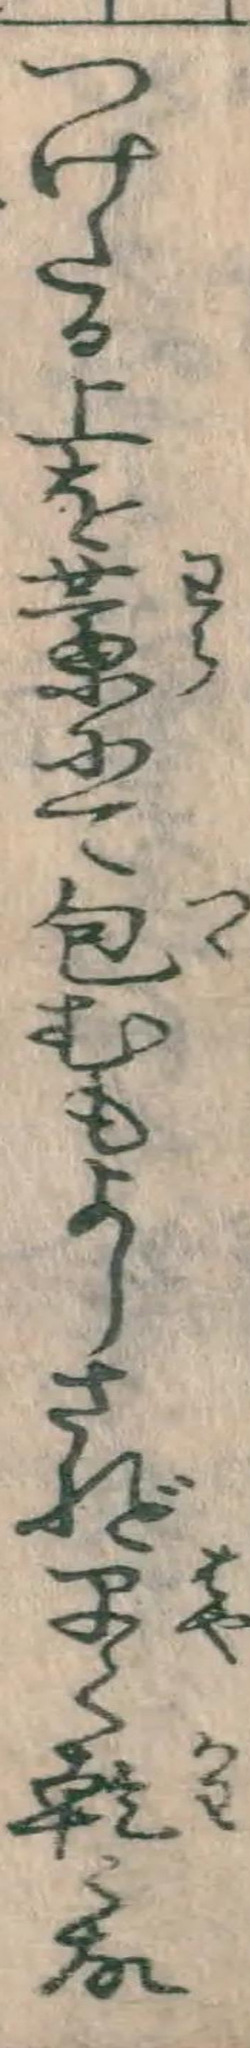つけたる上を藁にて包むもよしされど早く乾く故
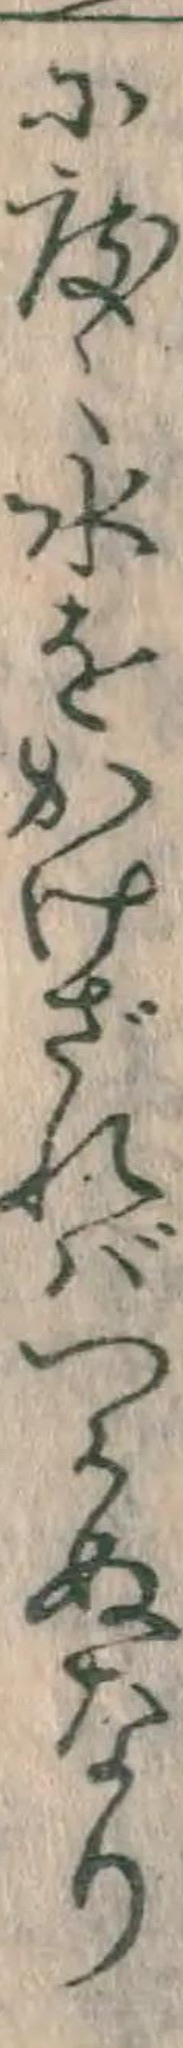に度々水をかけざればつかぬなり
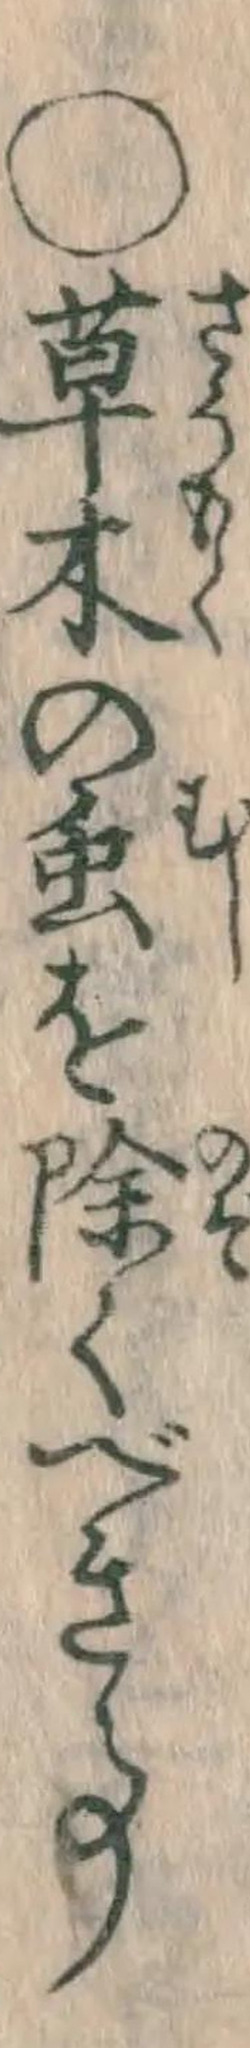○草木の虫を除くべき事
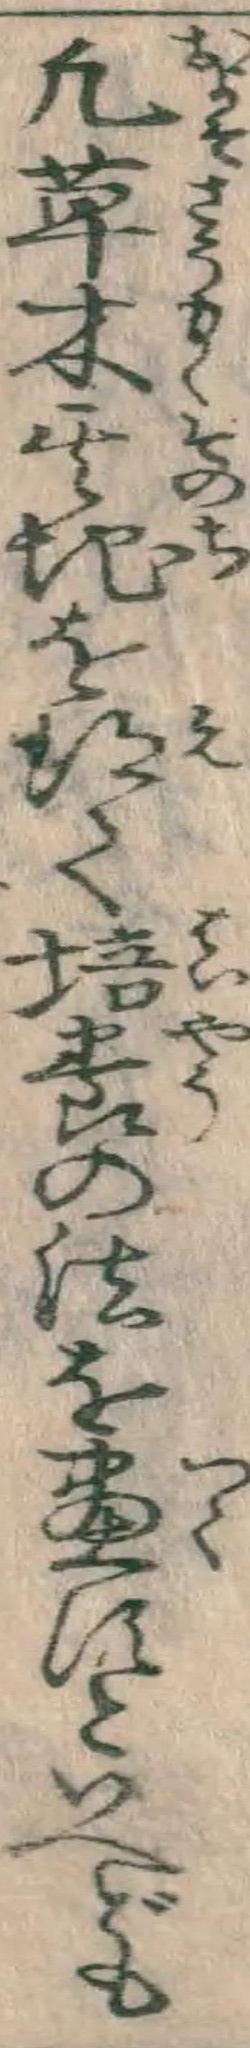凡草木其地を得て培養の法を尽すといへども
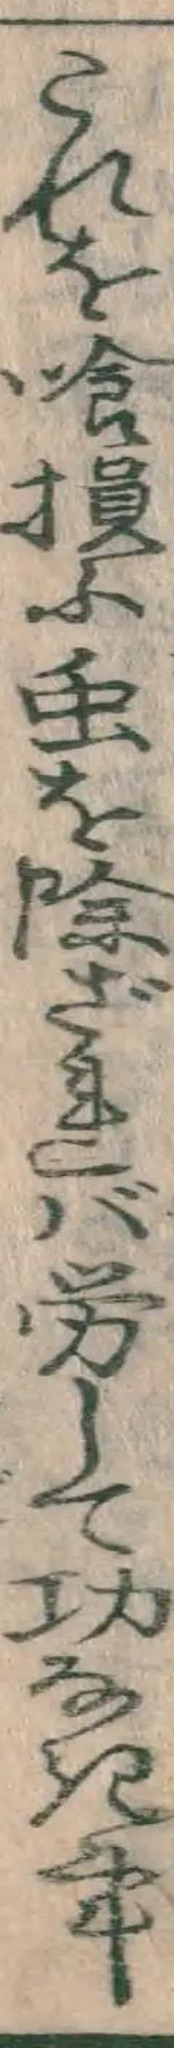これを喰損ふ虫を除ざれば労して功なき事
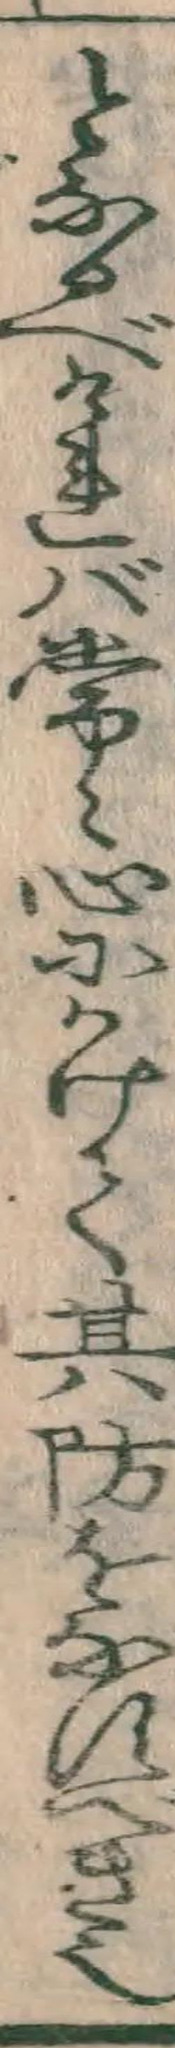となるべければ常々心にかけて其防をなすべき也
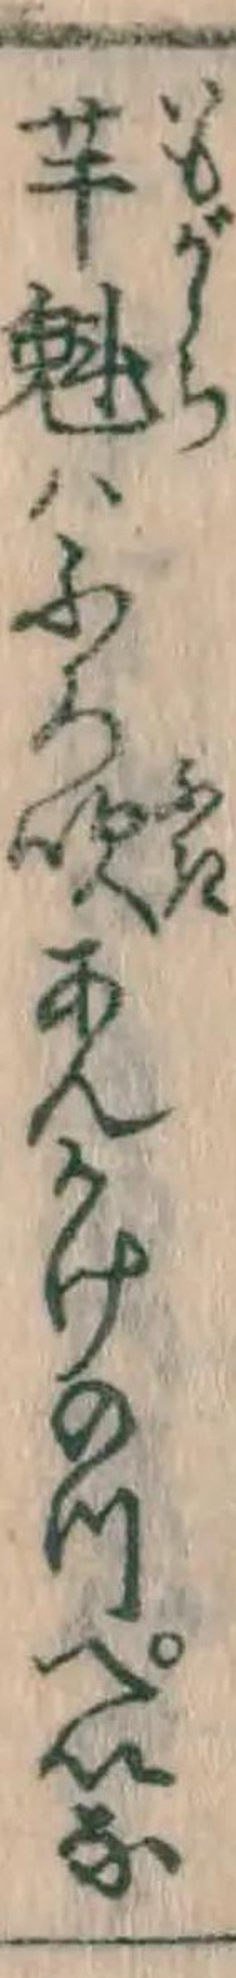芋魁はふろ吹あんかけのつぺいな
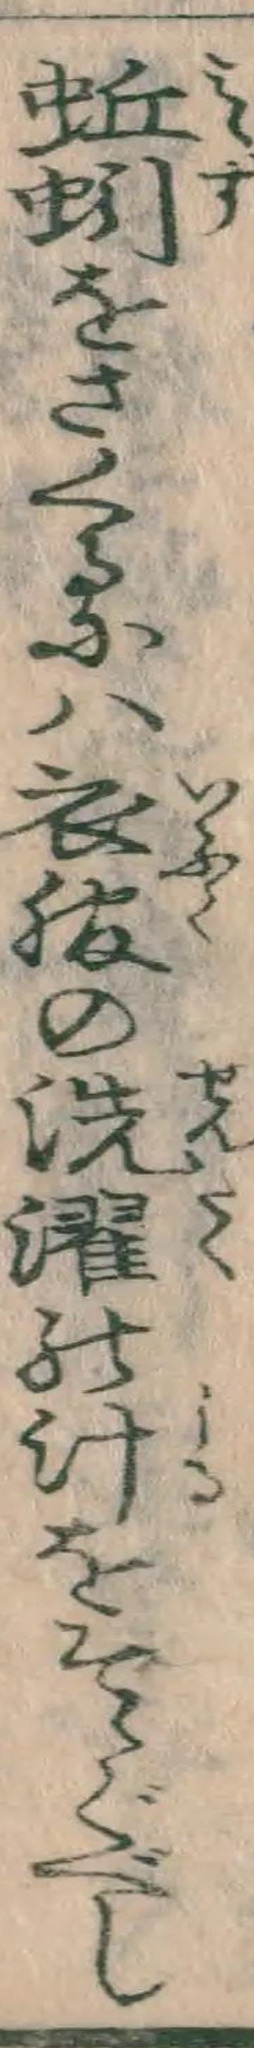蚯蚓をさくるには衣服の洗濯の汁をそゝぐべし
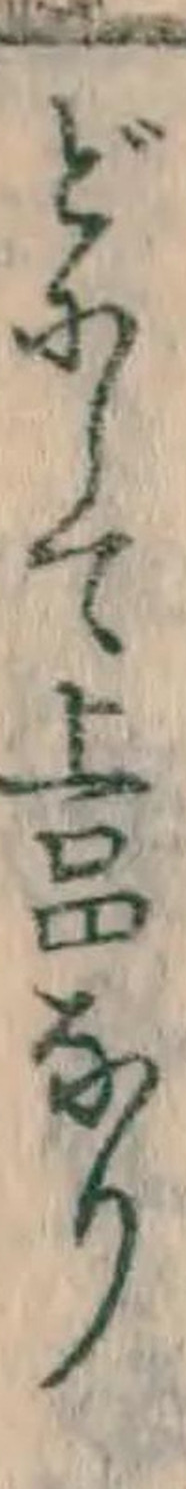どにして上品なり
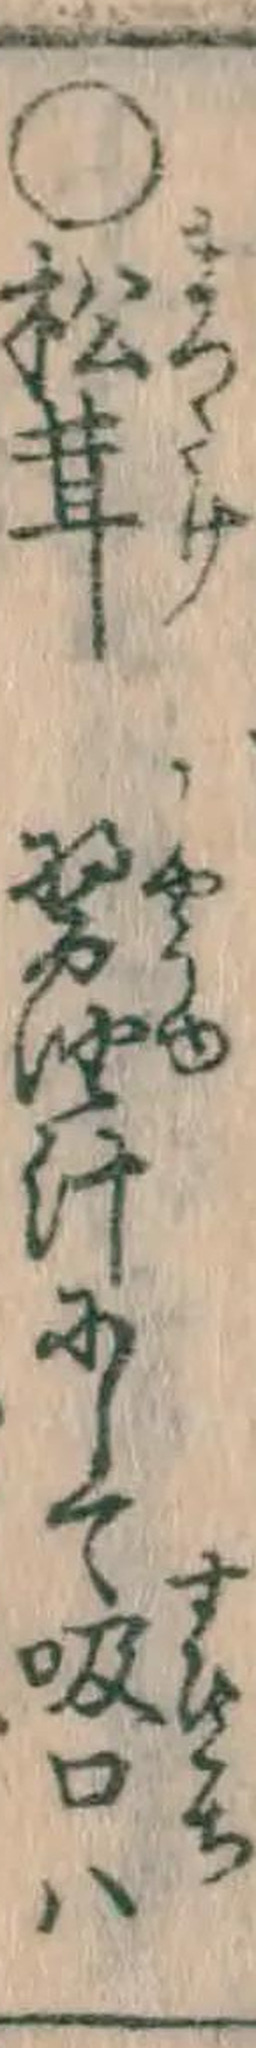○松茸醬油汁にして吸口は
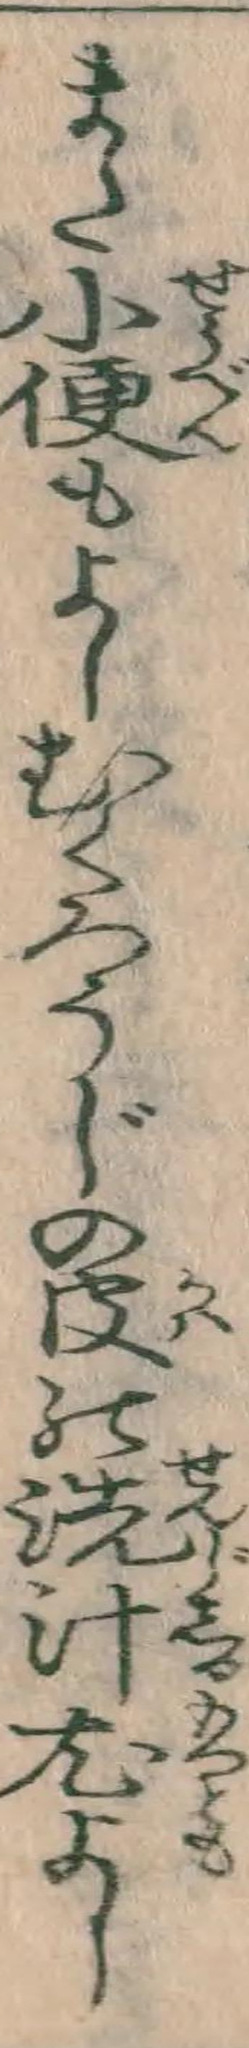また小便もよしむくろうじの皮の洗汁尤よし
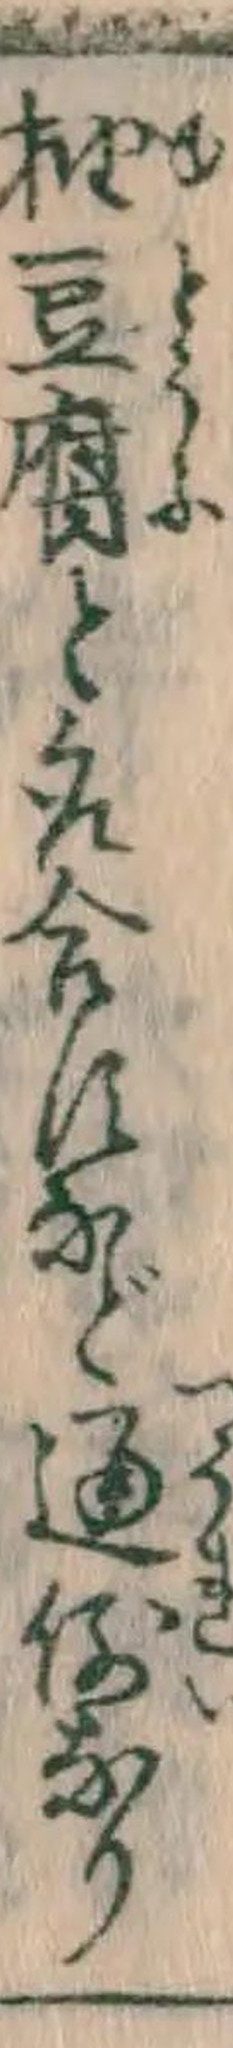柚豆腐と取合すなど通例なり
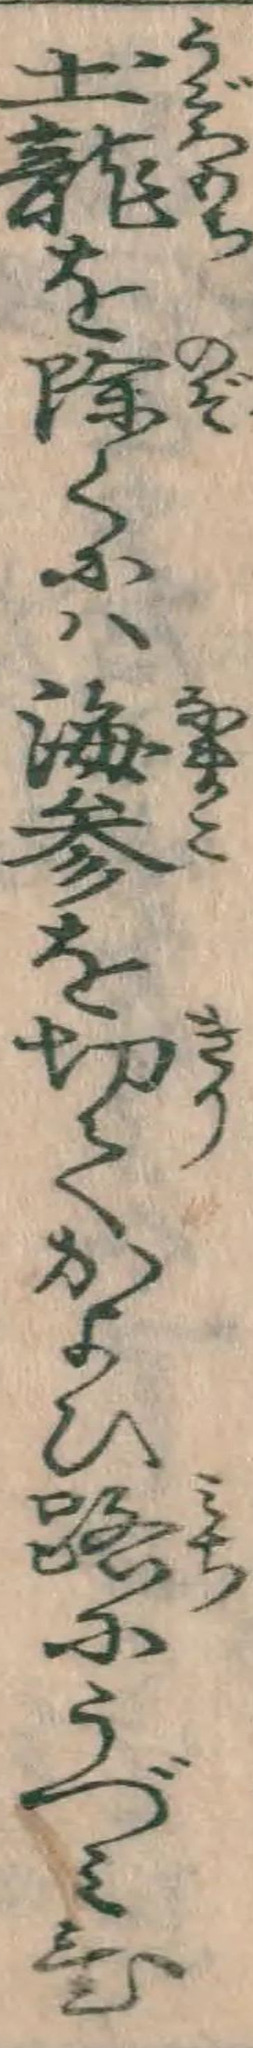土龍を除くには海参を切てかよひ路にうづみ置
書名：広益秘事大全 3巻. [5]
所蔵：国立国会図書館 National Diet Library, JAPAN
